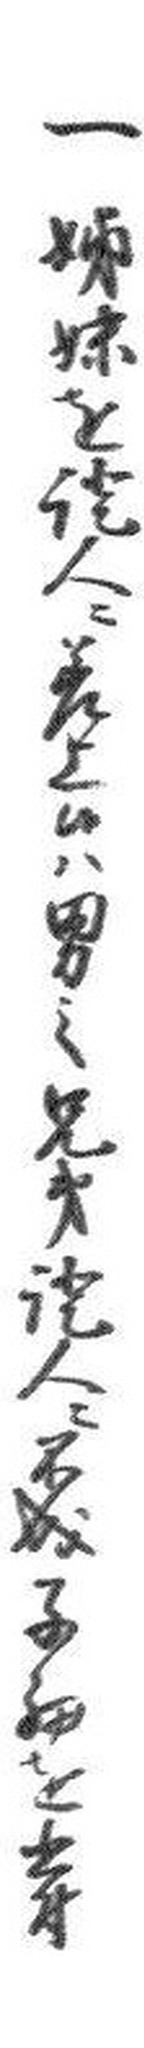一姉妹を証人ニ差上候ハ男之兄弟証人ニ不成子細を書付
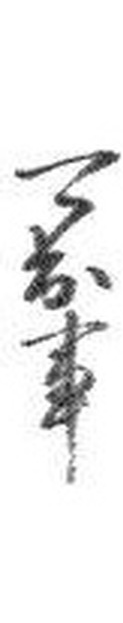可出事
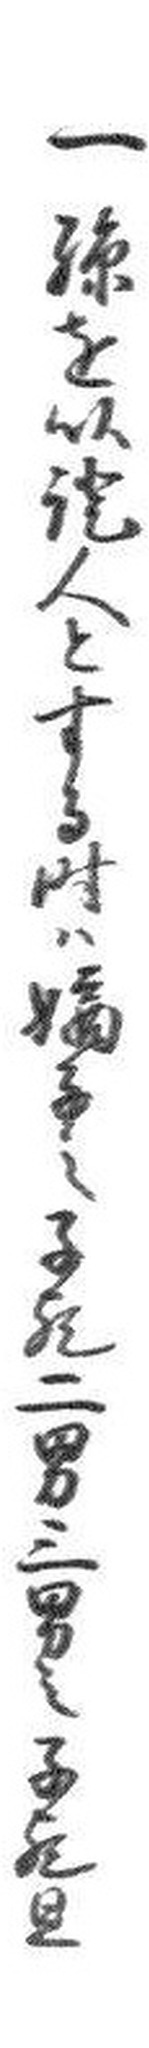一孫を以証人とする時ハ嫡子之子歟二男三男之子歟且
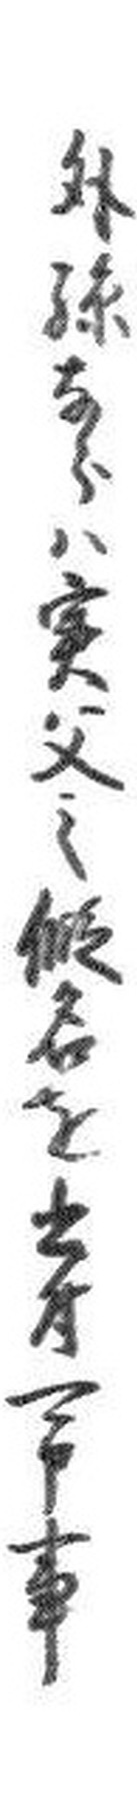外孫ならハ実父之仮名を書付可申事
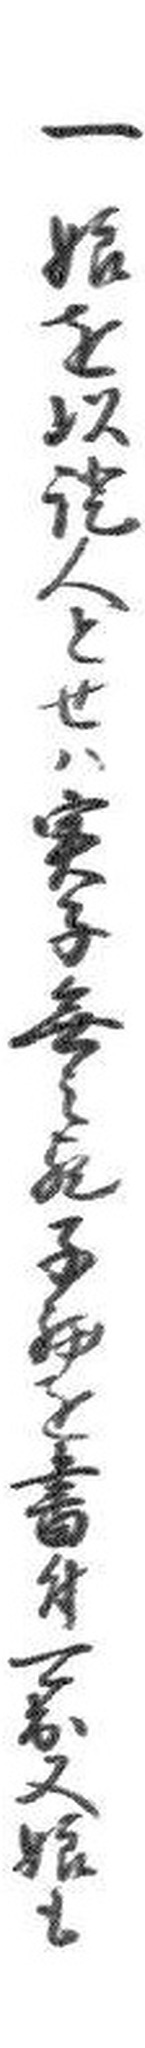一娘を以証人とせハ実子無之歟子細を書付可出又娘も
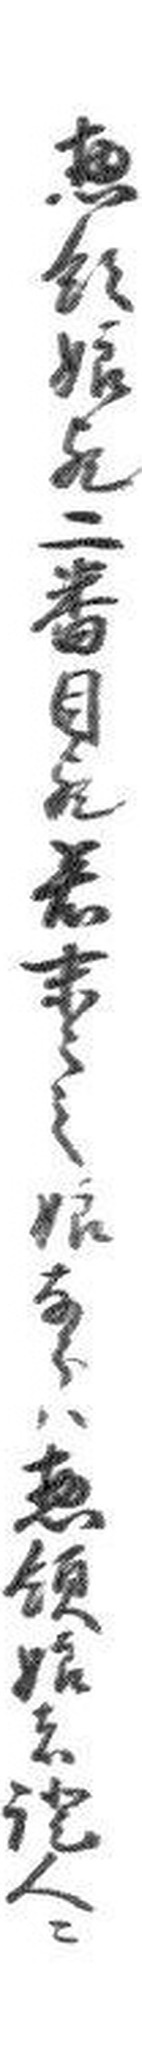惣領娘歟二番目歟若末々之娘ならハ惣領娘者証人ニ
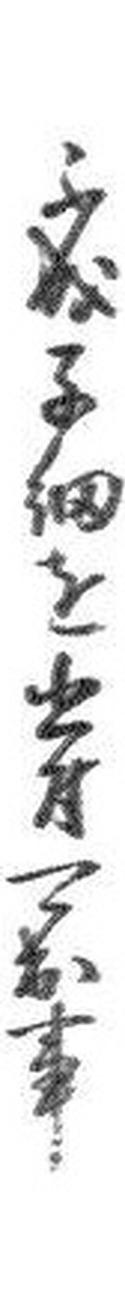不成子細を書付可出事
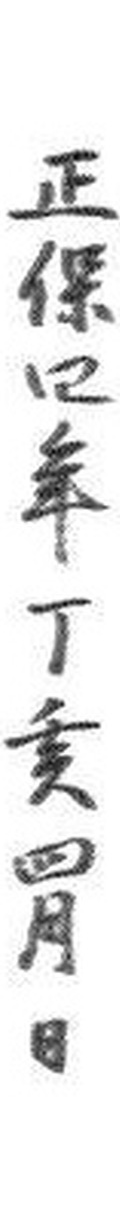正保四年丁亥四月日
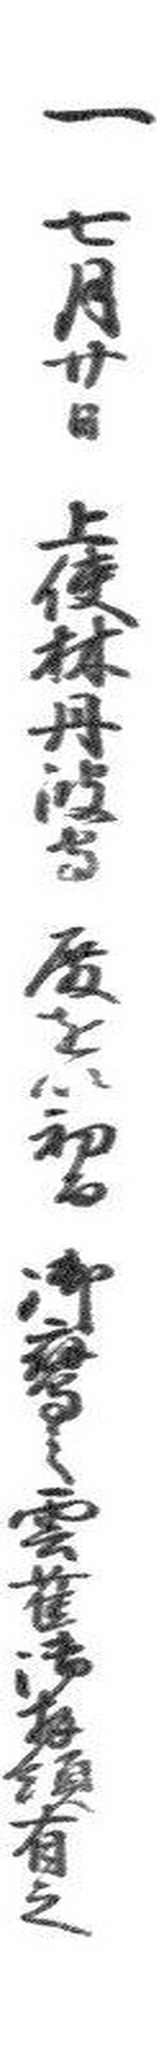一七月廿日上使林丹波守殿を以初而御鷹之雲雀御拝領有之

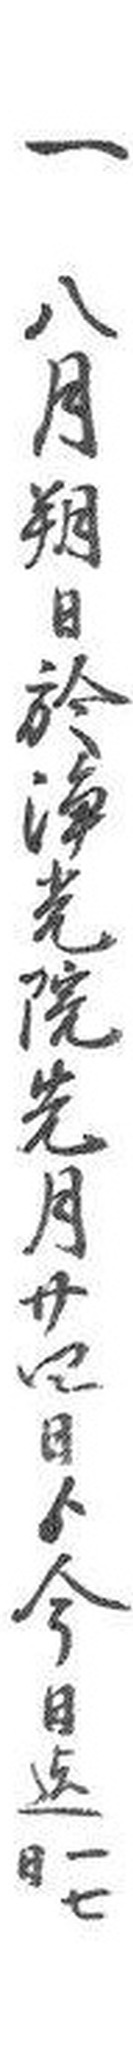一八月朔日於浄光院先月廿四日ゟ今日迄一七日
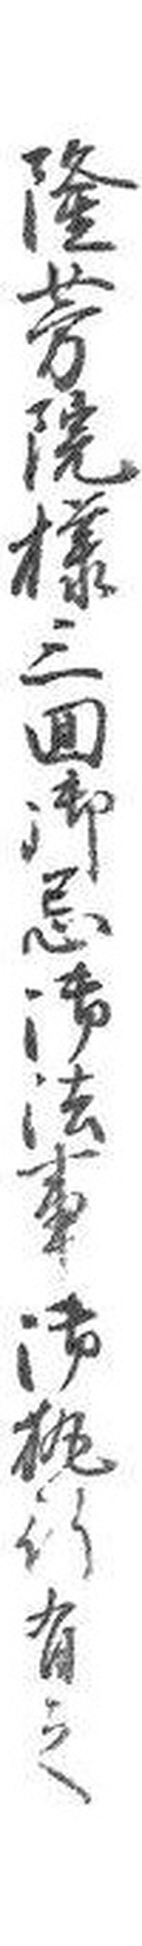隆芳院様三回御忌御法事御執行有之
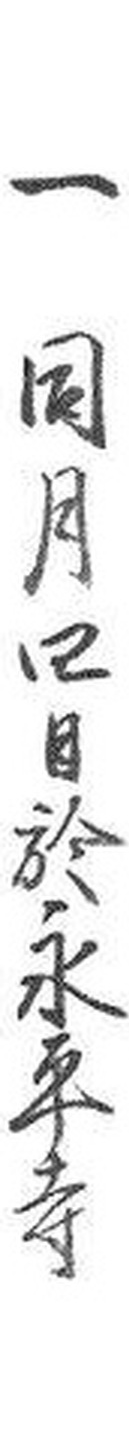一同月四日於永平寺
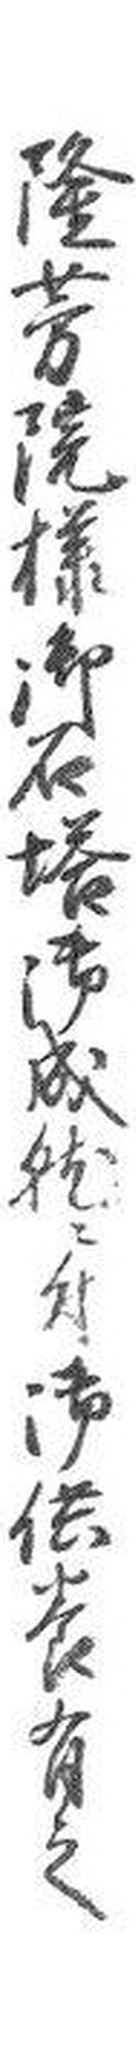隆芳院様御石塔御成就ニ付御供養有之
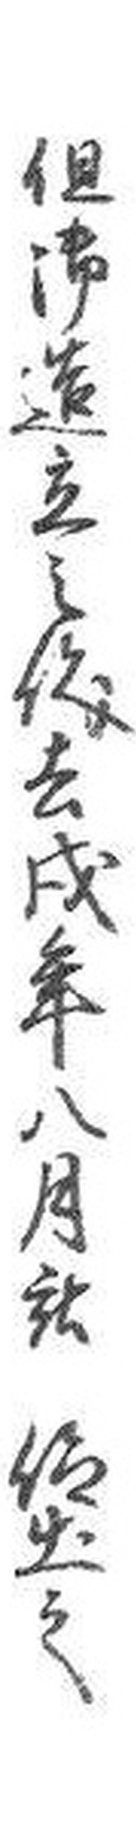但御造立之儀去戌年八月被仰出之
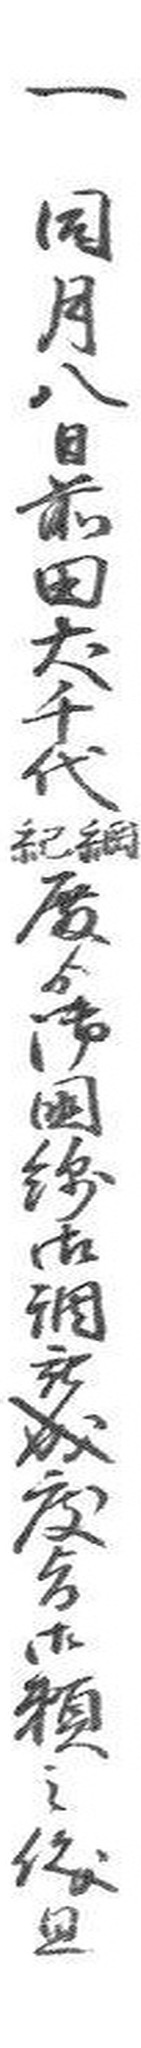一同月八日前田犬千代綱紀殿ゟ御国綿御調被成度旨御頼之儀且
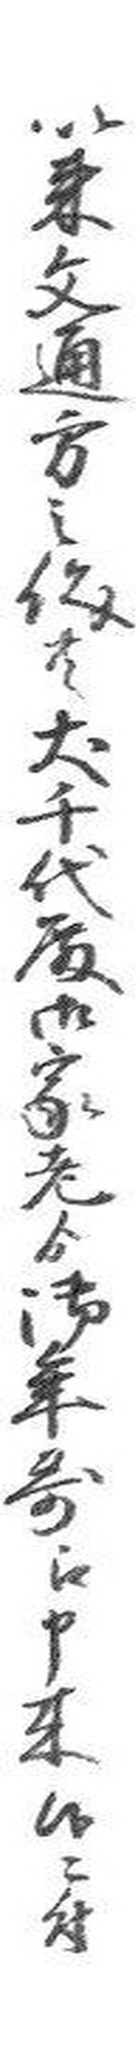以来文通方之儀共犬千代殿御家老ゟ御年寄江申来候ニ付
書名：家譜 五 光通公 従寛永十三年到万治二年
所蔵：福井県文書館 Fukui Prefectural Archives
